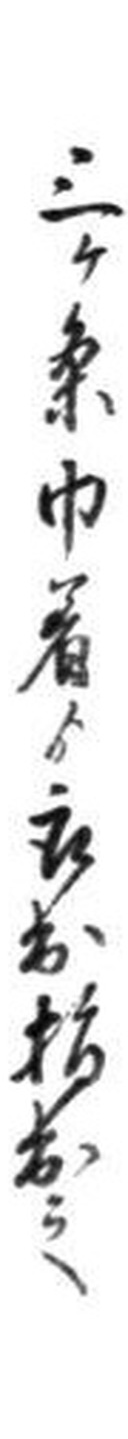三ケ条巾着ゟ取出指出之
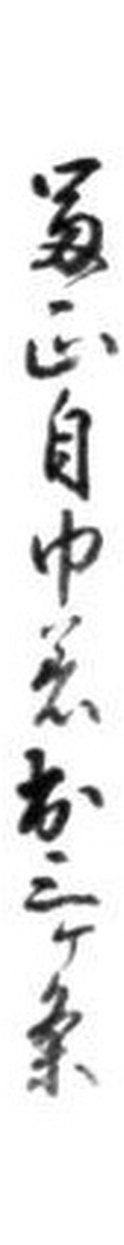富正自巾着出三ケ条
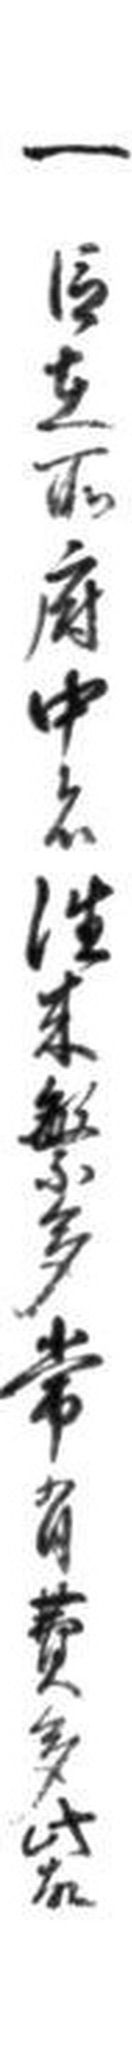一臣在所府中者往来繁多常有費多此故
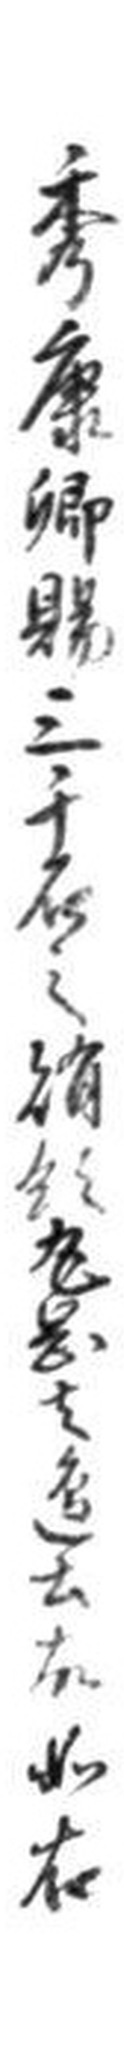秀康卿賜三千石之賄領丸岡者辺土故如右
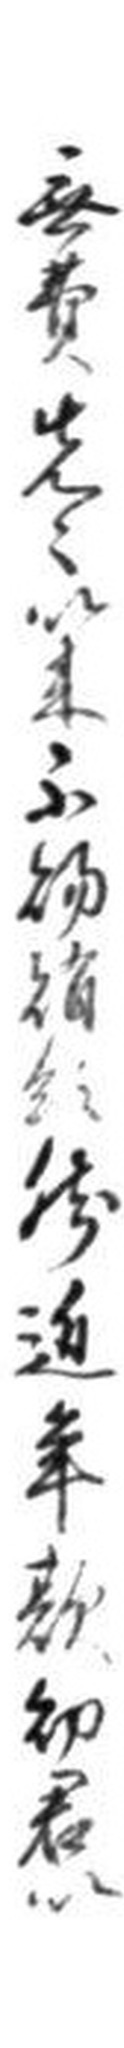無費先々以来不賜賄領然近年欺幼君以
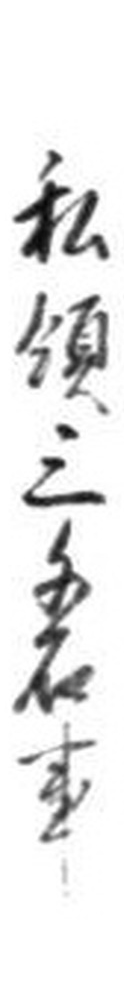私領三千石事
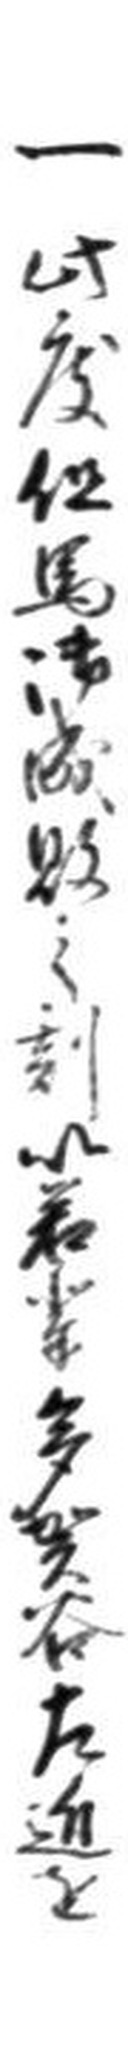一此度但馬御成敗之刻以若輩多賀谷左近を
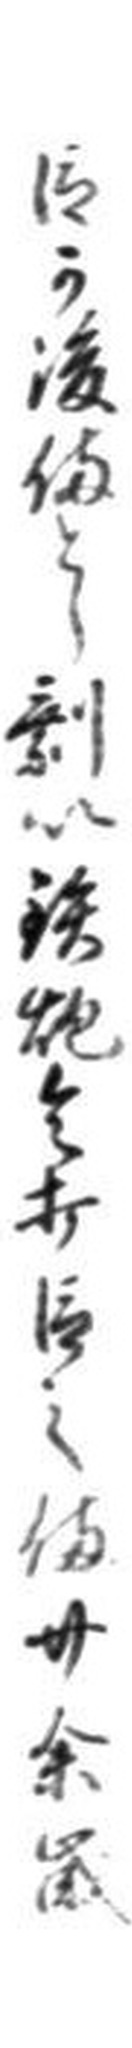臣か後備とし剰以鉄炮令打臣之備廿四歳
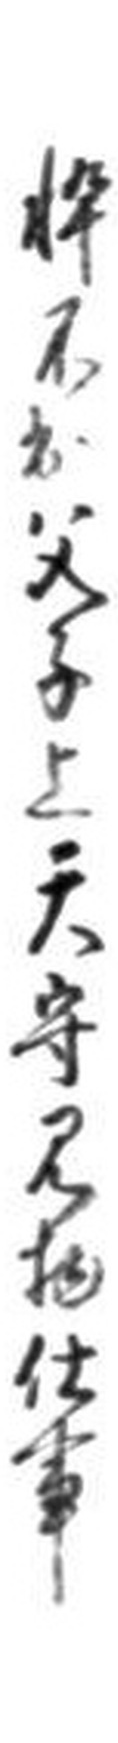忰不出父子上天守見物仕事
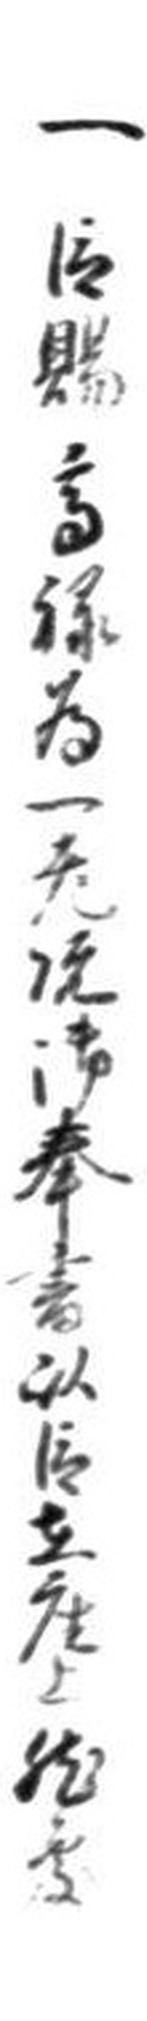一臣賜高禄為一老御奉書以臣在座上然処
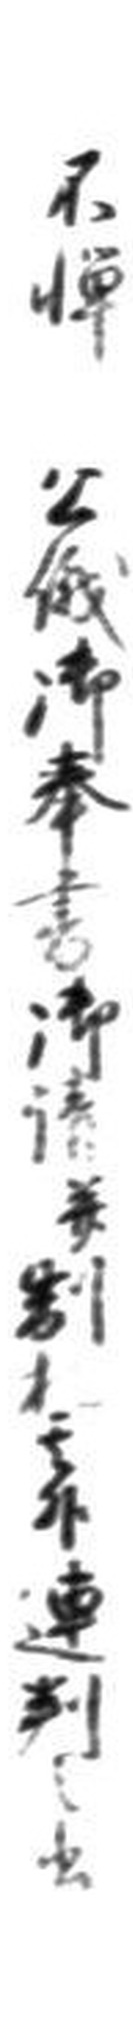不憚公儀御奉書御請并制札其外連判之書
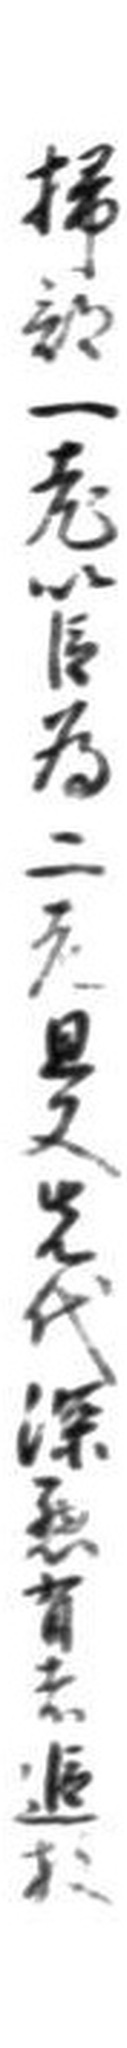掃部一老以臣為二老且又先代深悪有者追放
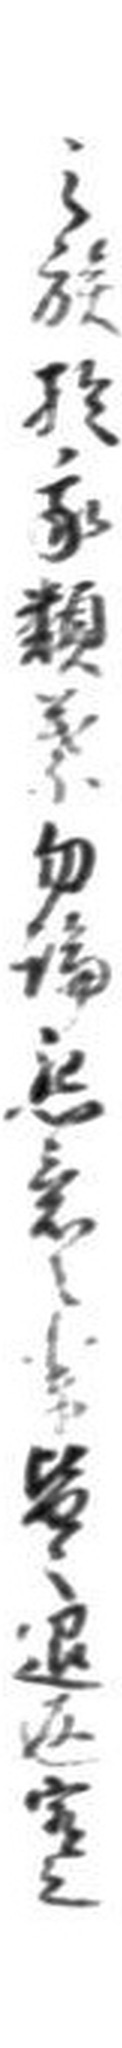之族於我類葉勿論懇意之輩皆々退返
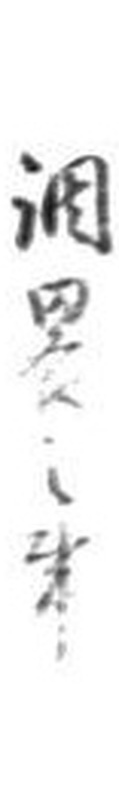調略之事
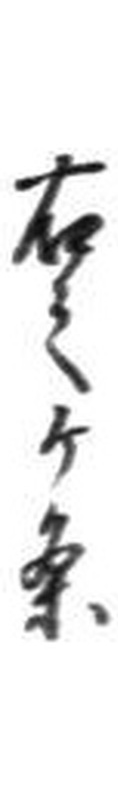右之ケ条
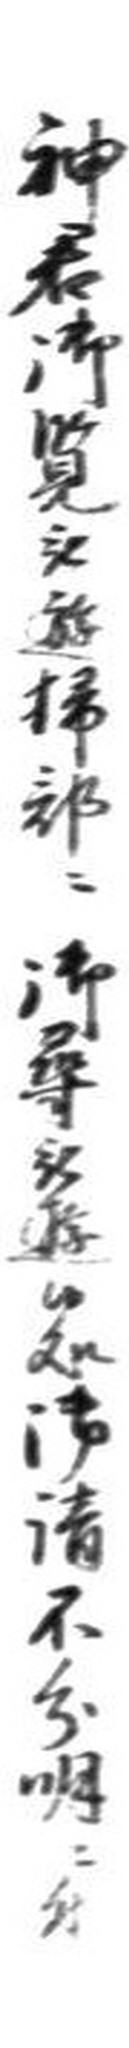神君御覧被遊掃部ニ御尋被遊候処御請不分明ニ付
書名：家譜 二 忠直公 従文禄四年到慶安四年
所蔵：福井県文書館 Fukui Prefectural Archives
